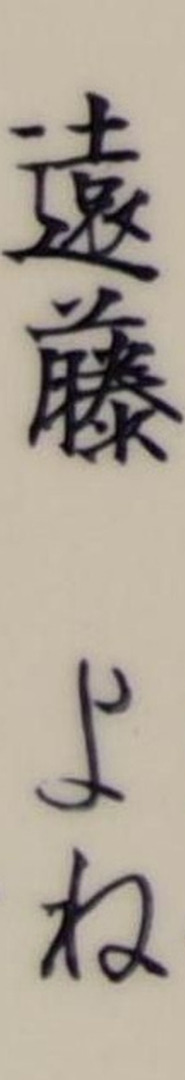遠藤よね
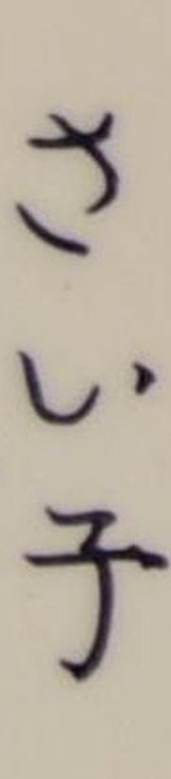さい子
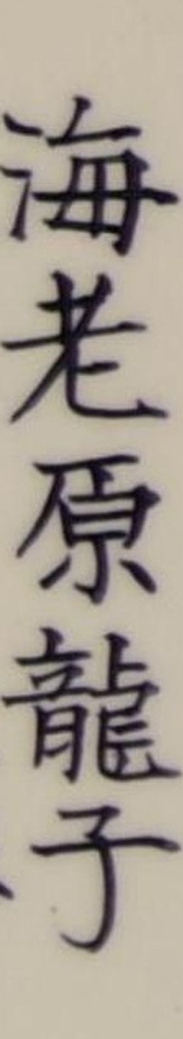海老原龍子
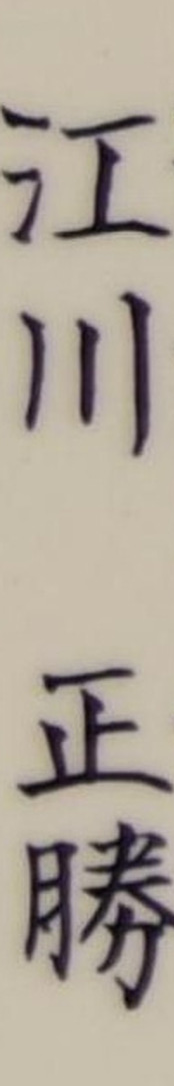江川正勝
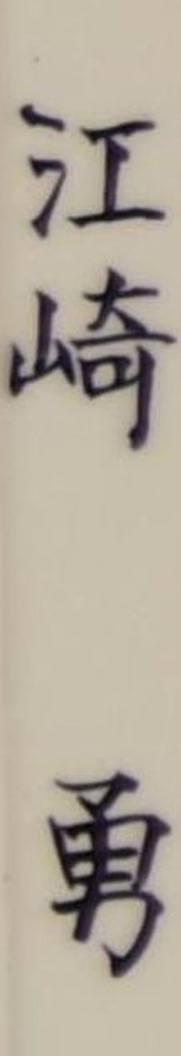江崎勇

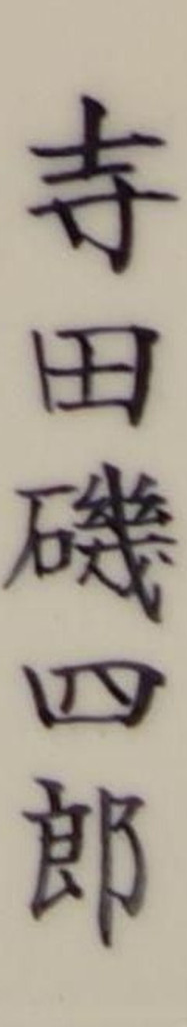寺田磯四郎
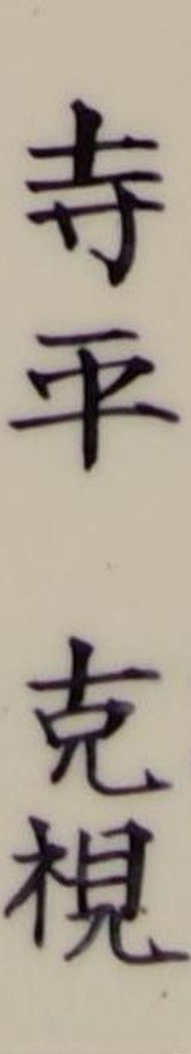寺平克現
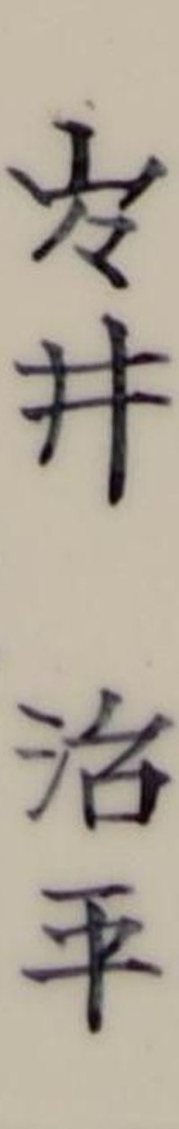㞮井治平
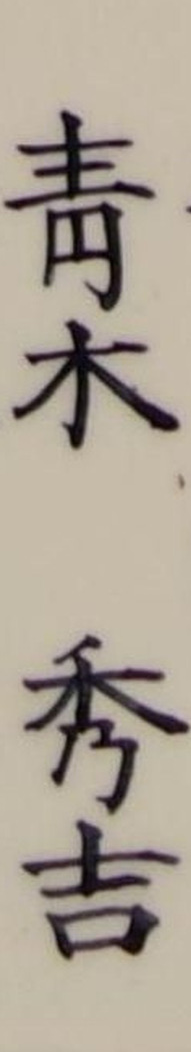青木秀吉
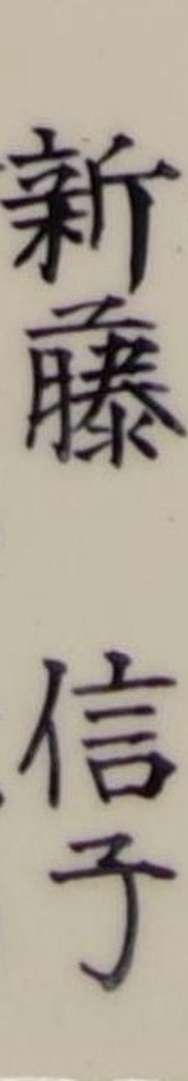新藤信子
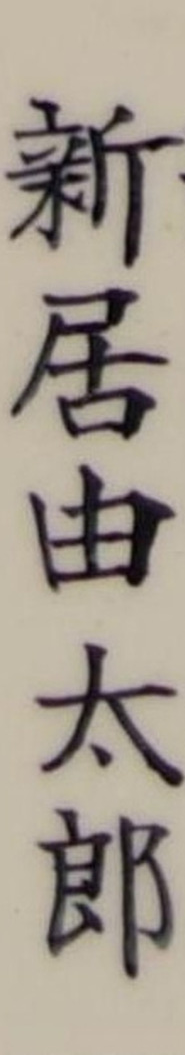新居由太郎
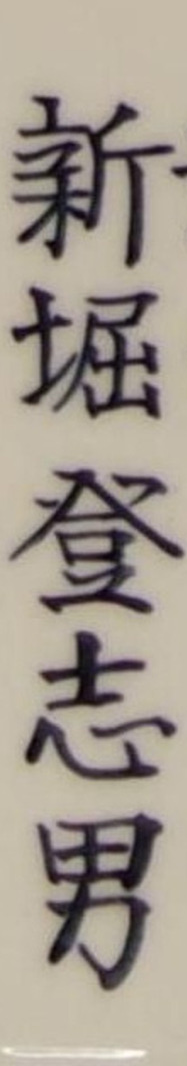新堀登志男
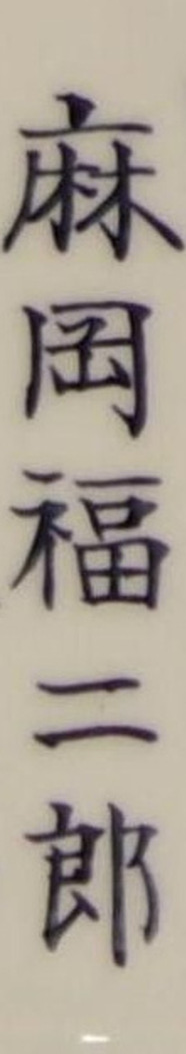麻岡福二郎
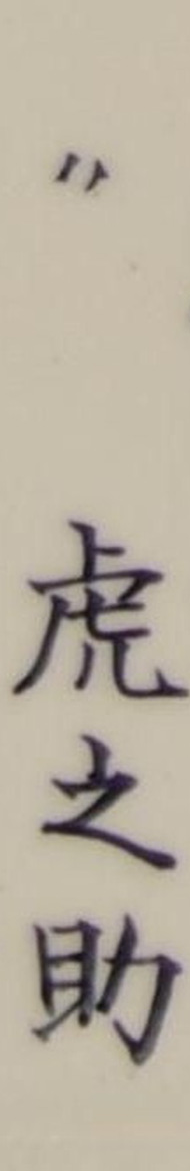虎之助
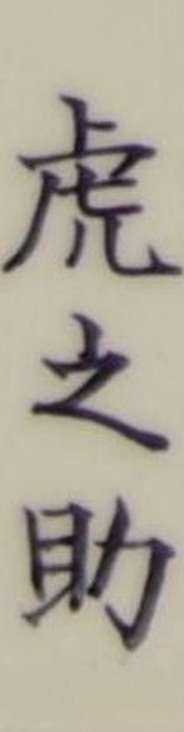虎之助
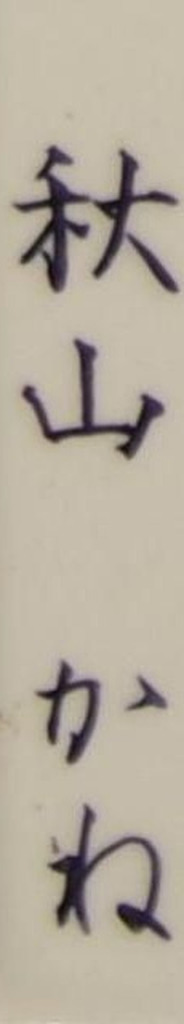秋山かね
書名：E~L
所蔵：高野山金剛峯寺
